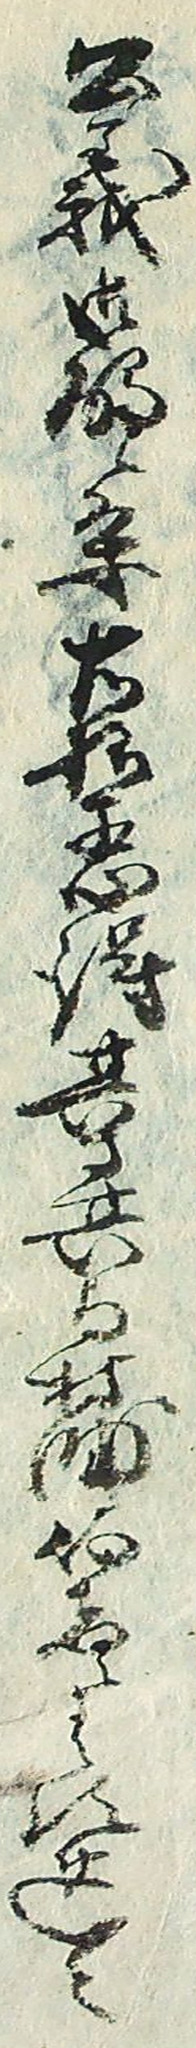公義御触候条右様相心得其方共与村浦何者によらす逸々
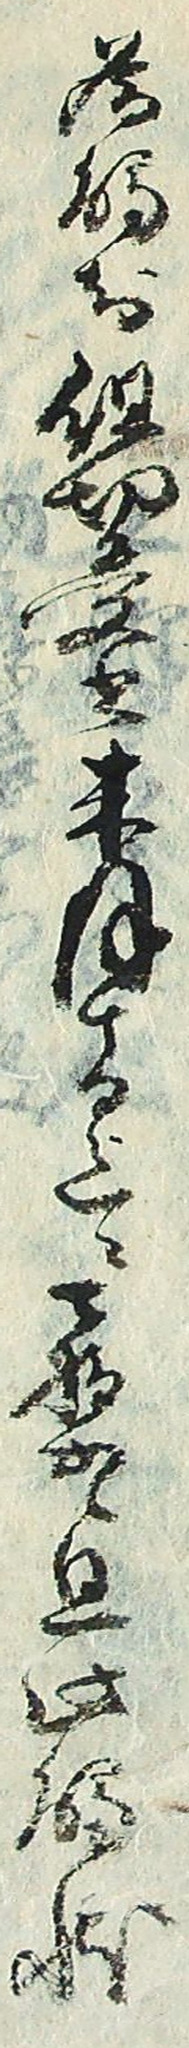為触知組切受書来月十日迄に可指出候且此触状
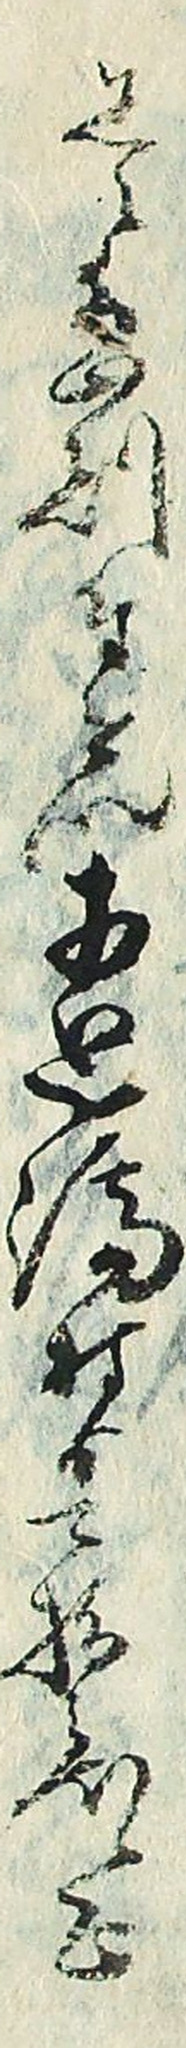先々急刻付を以相廻済村ゟ可指戻候以上
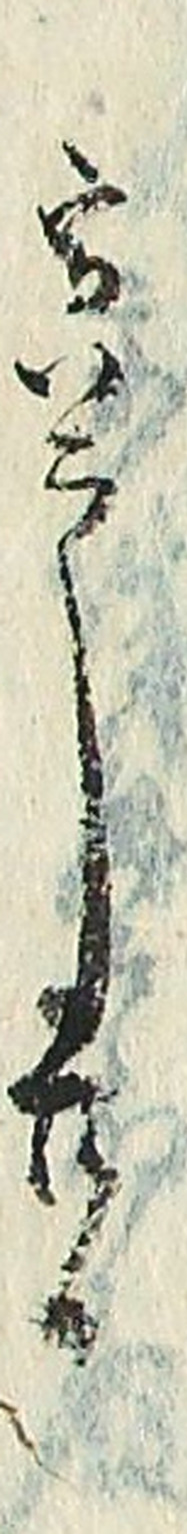寅二月廿日

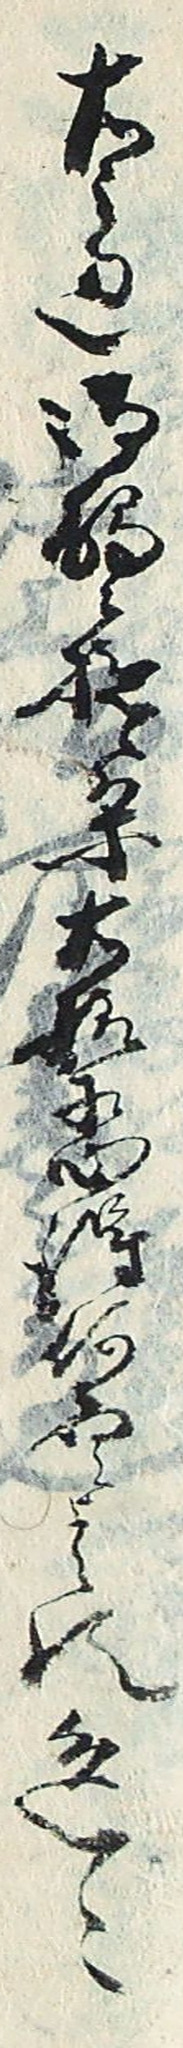右之通御触被遊候条右様相心得何者によらす逸々
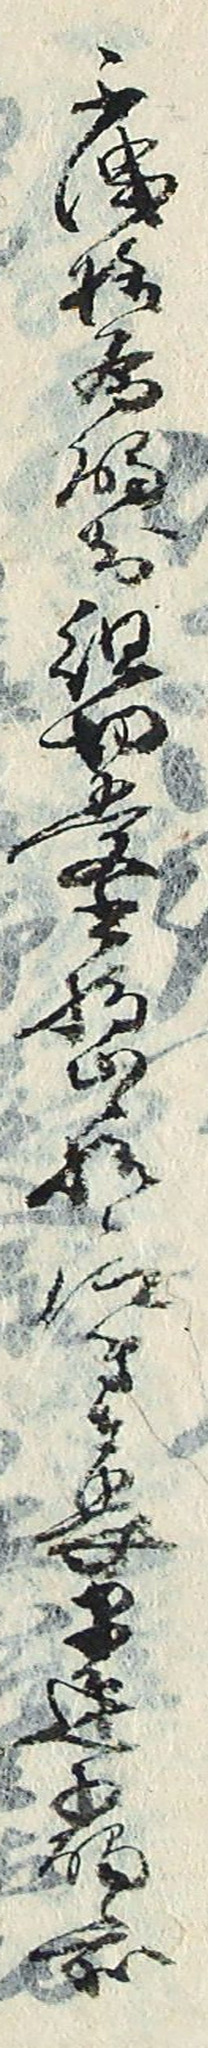不洩様為触知組切受書指出候様被仰付奉畏早速
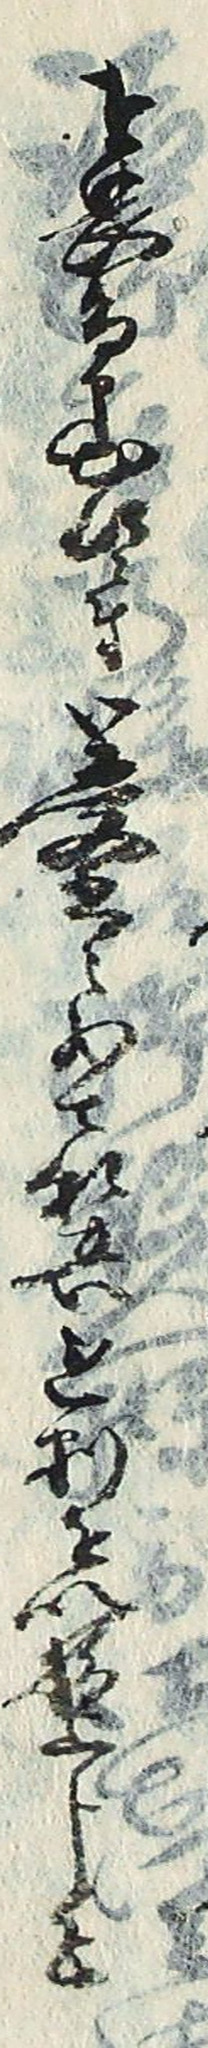奉畏旨申出候に付御受書之義は私共連判を以指上申候以上
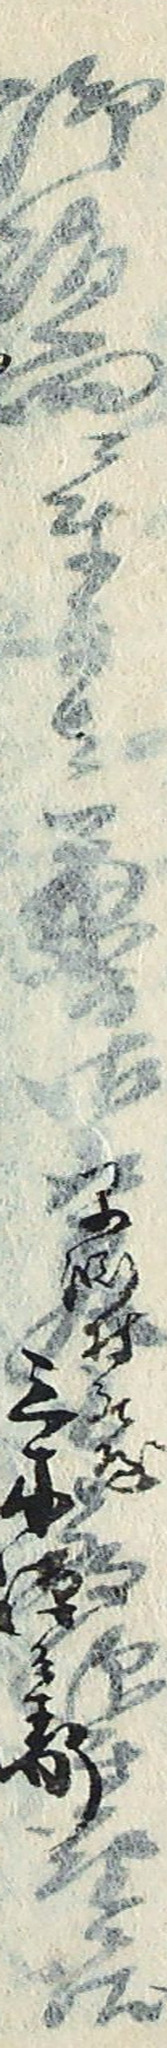早淵村庄屋
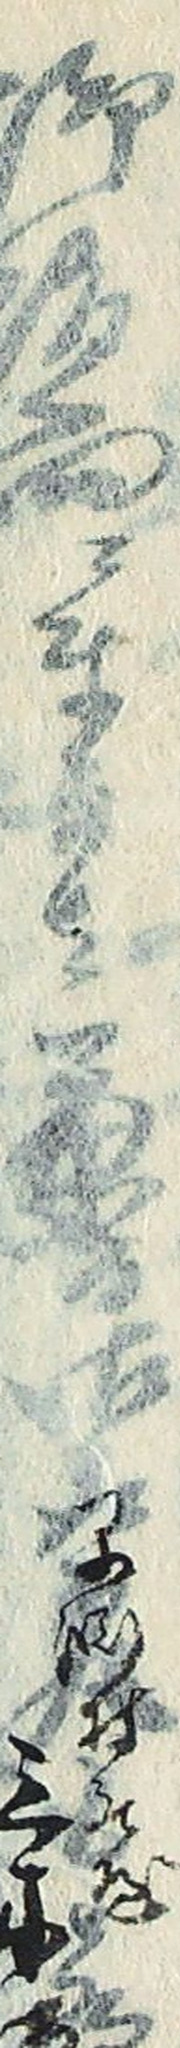早淵村庄屋
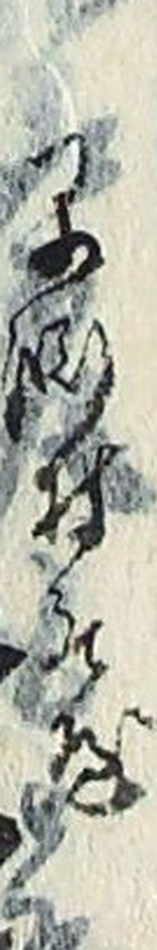早淵村庄屋
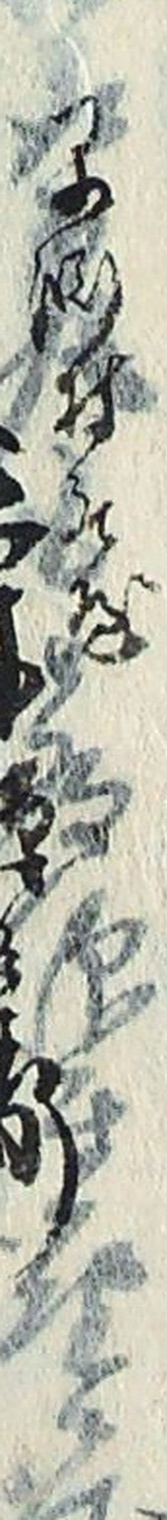早淵村庄屋
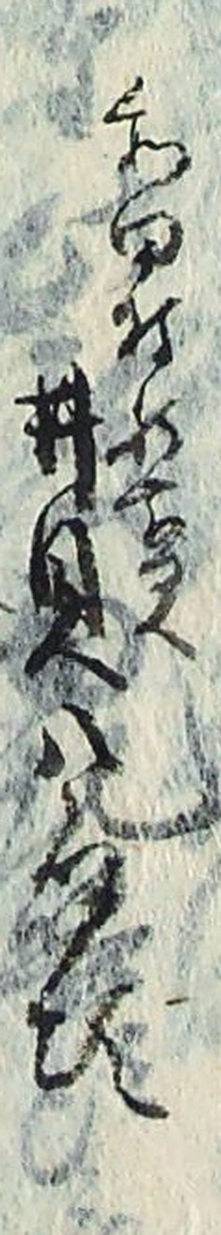井貝八郎次
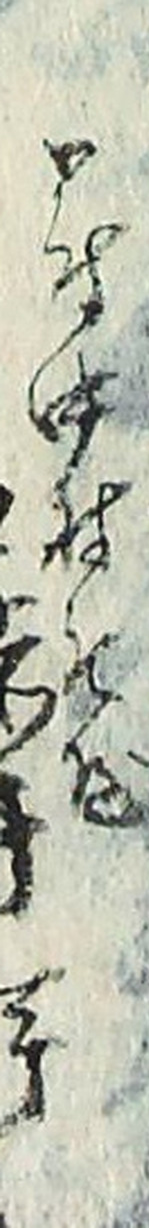府中村庄屋
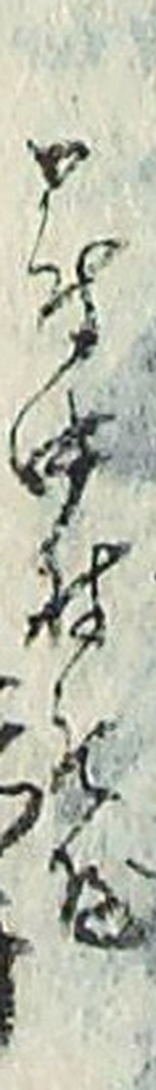府中村庄屋
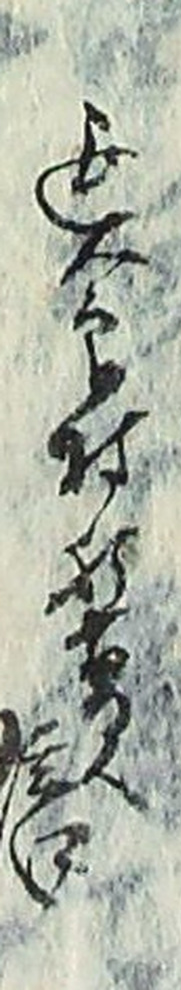延命村肝煎
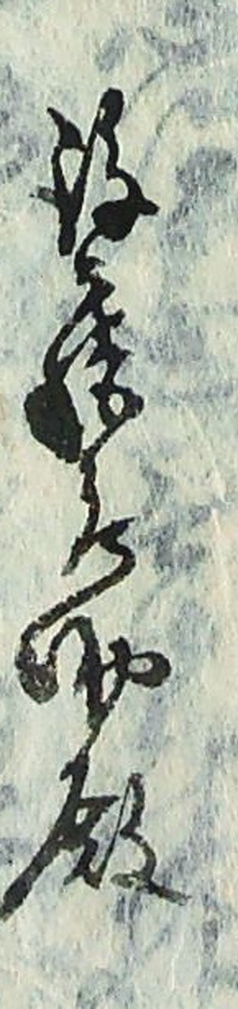後藤庄助殿
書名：諸御用御□受書控
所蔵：鳴門教育大学 Naruto University of Education
